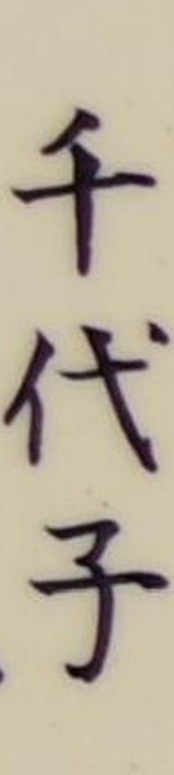千代子

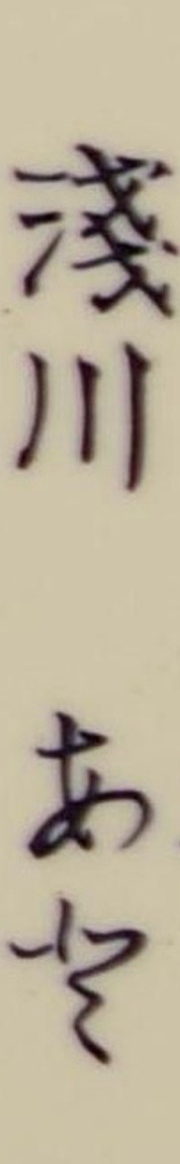浅川あと
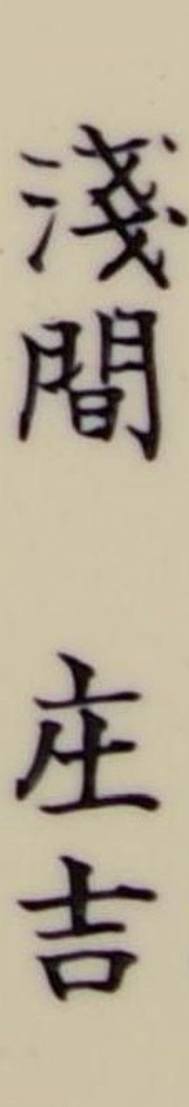浅間庄吉
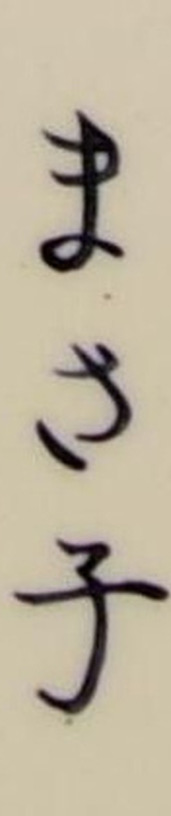まさ子
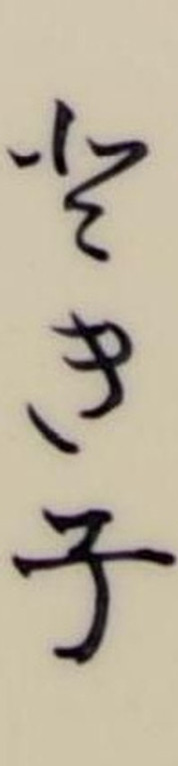とき子
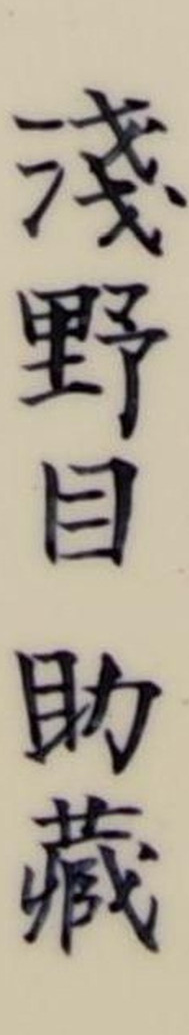浅野目助蔵
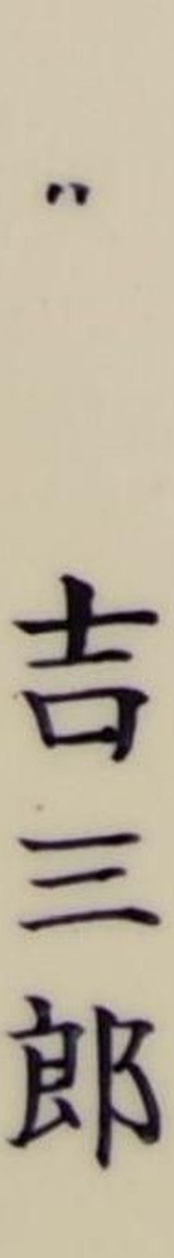吉三郎
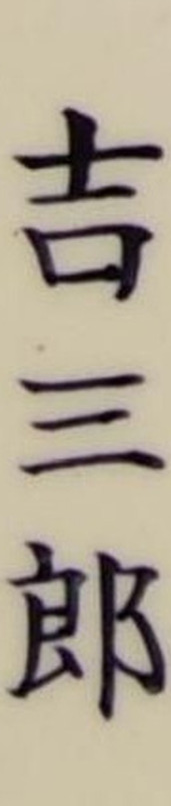吉三郎
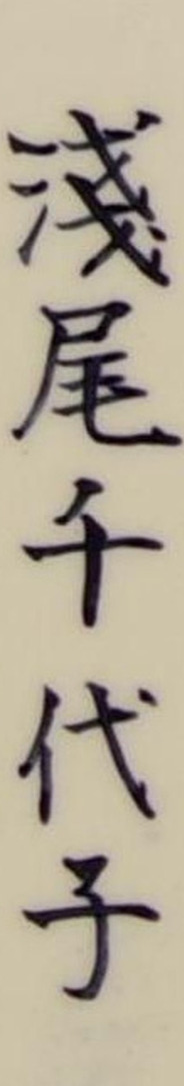浅尾千代子
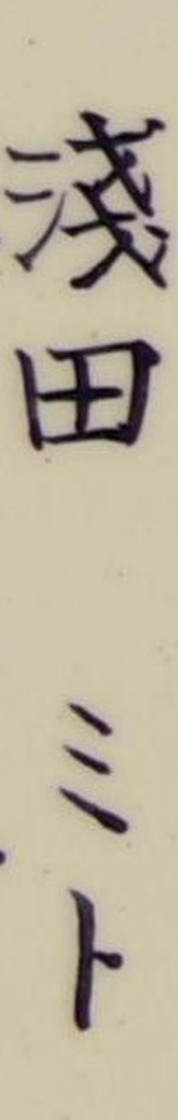浅田ミト
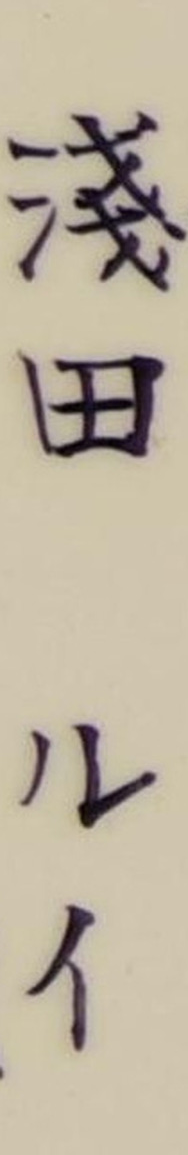浅田ルイ

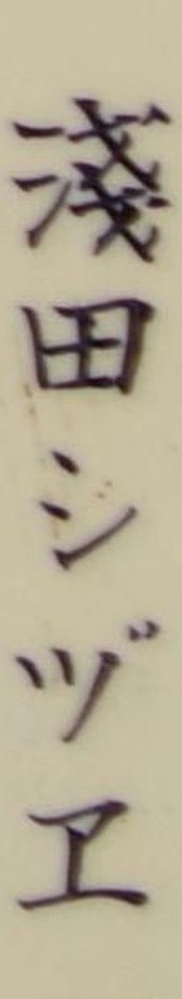浅田シヅヱ
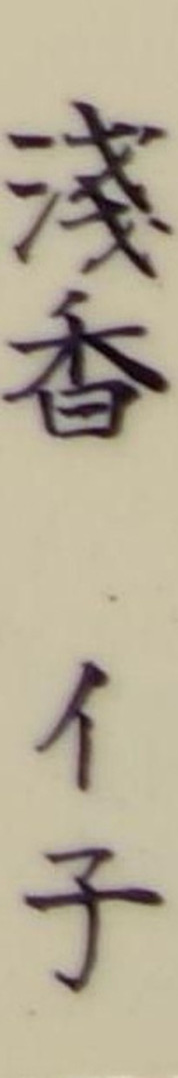浅香イ子
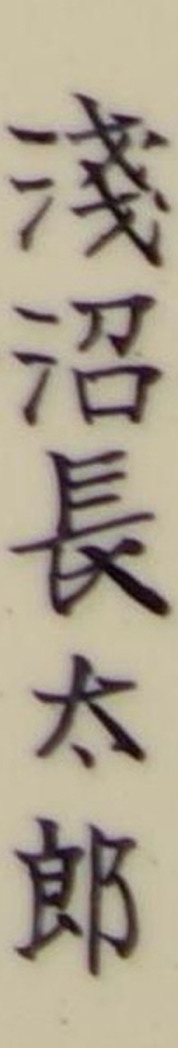浅沼長太郎
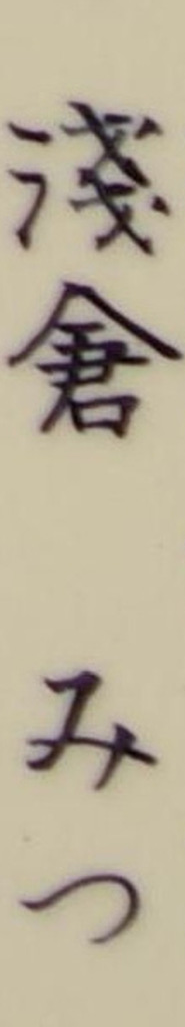浅倉みつ
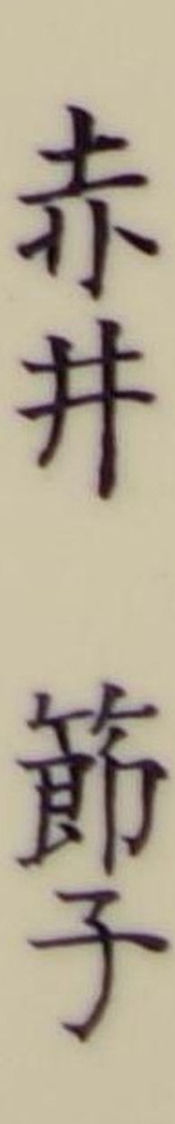赤井節子
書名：E~L
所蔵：高野山金剛峯寺
